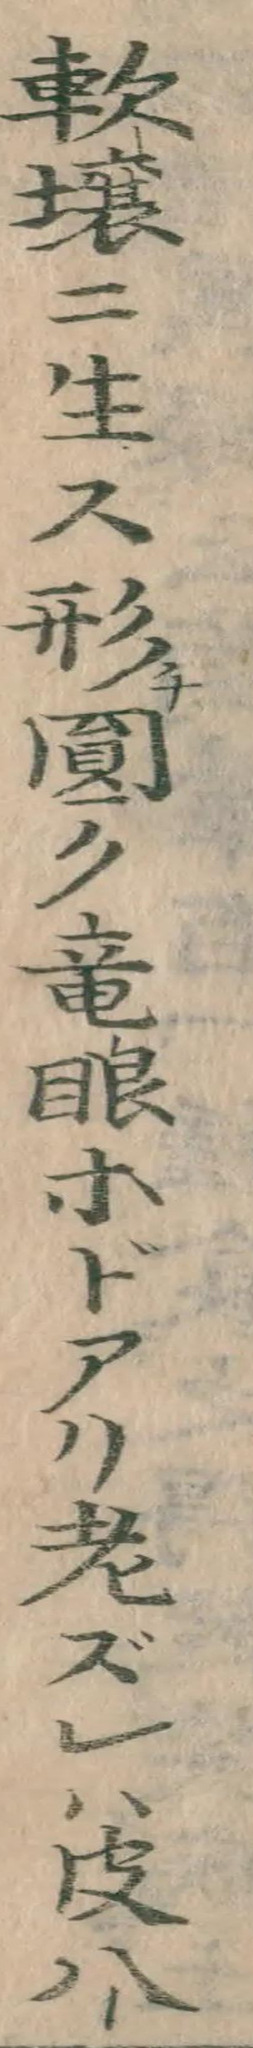軟壌ニ生ス形円ク竜眼ホドアリ老ズレハ皮八
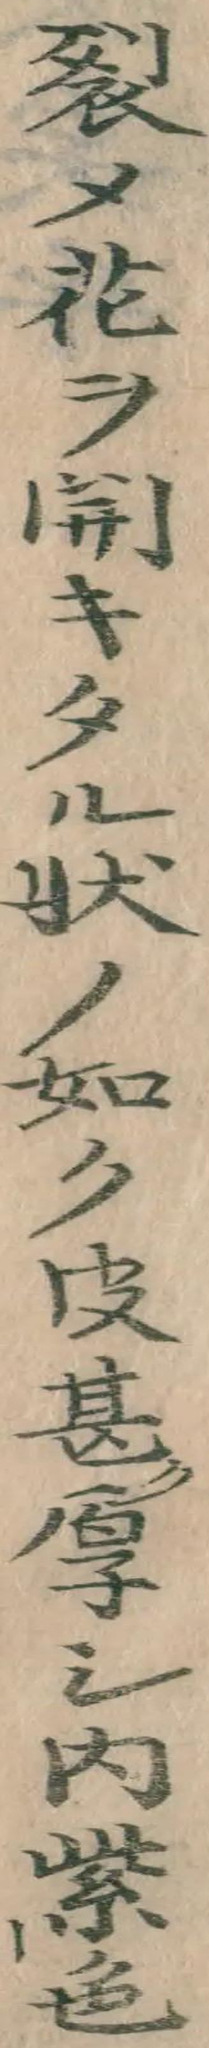裂シテ花ヲ開キタル状ノ如ク皮甚厚シ内紫色
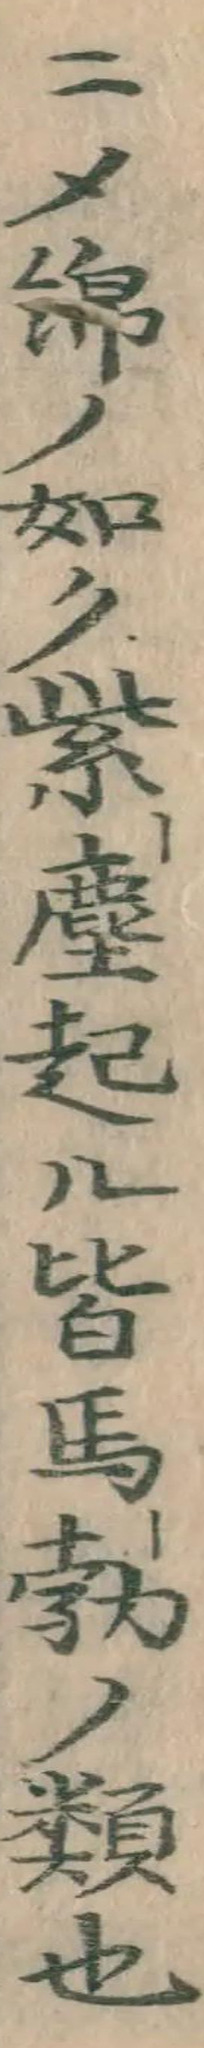ニシテ綿ノ如ク紫塵起ル皆馬勃ノ類也

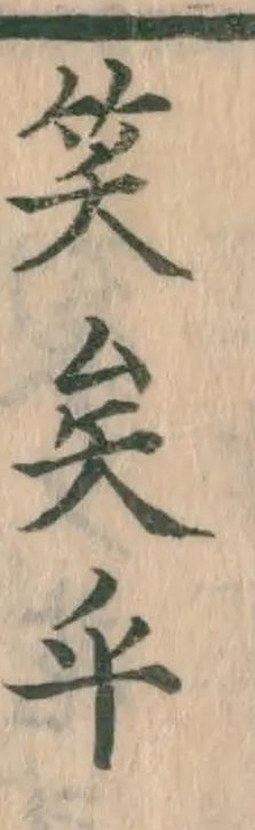笑矣乎
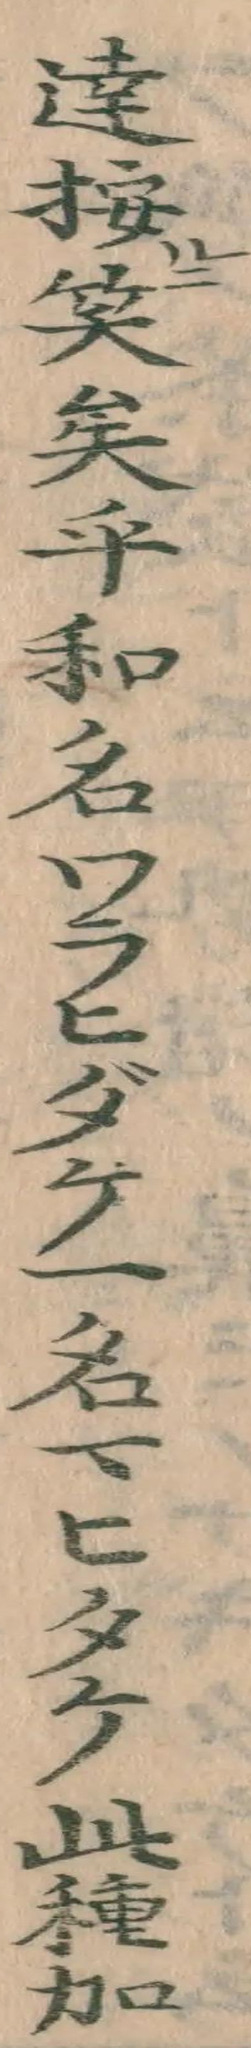達按笑矣乎和名ワラヒダケ一名マヒタケ此種加
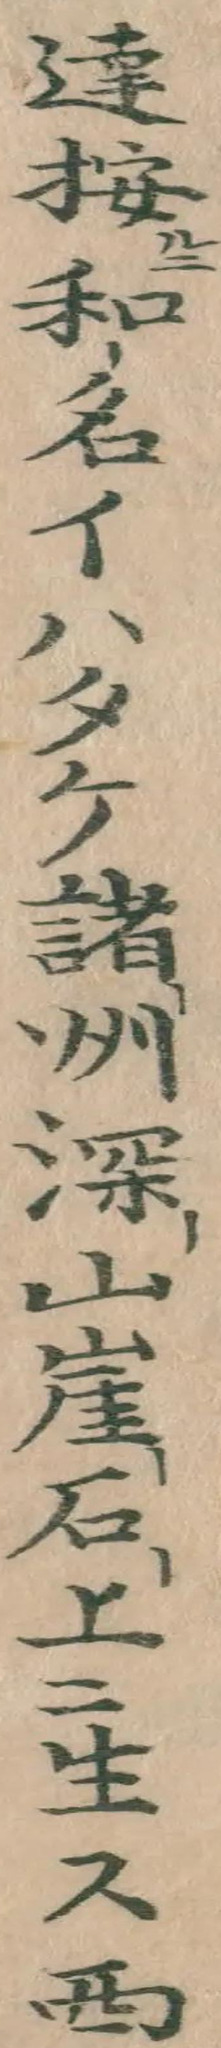達按和名イハタケ諸州深山崖石上ニ生ス西
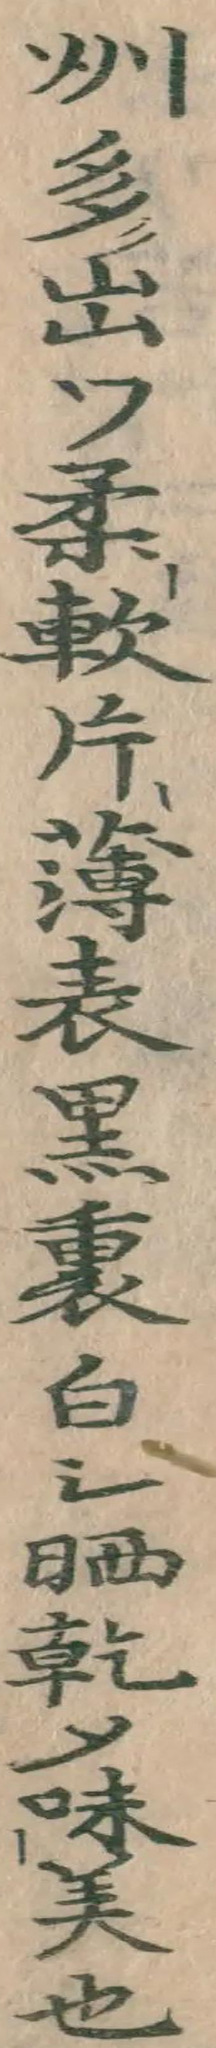州多出ツ柔軟片薄表黒裏白シ晒乾シテ味美也
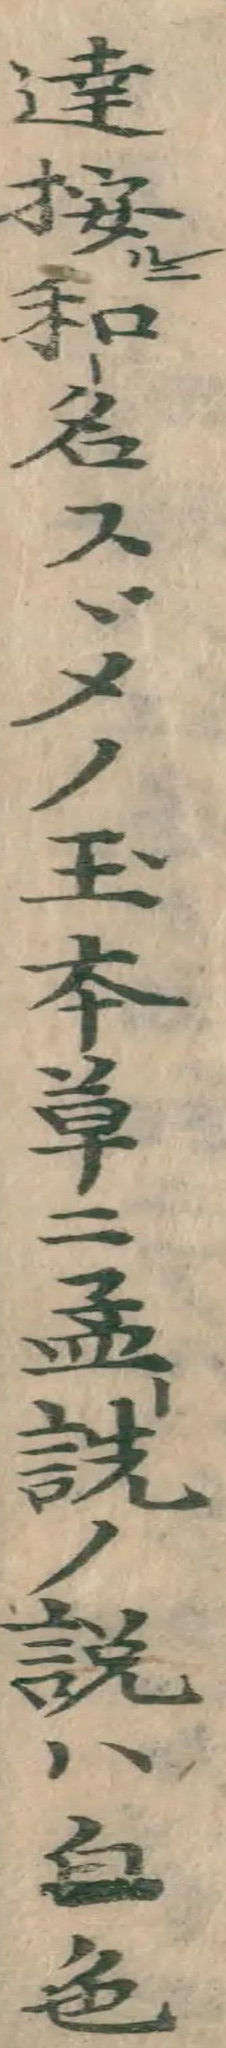達按和名スヾメノ玉本草ニ孟詵ノ説ハ白色

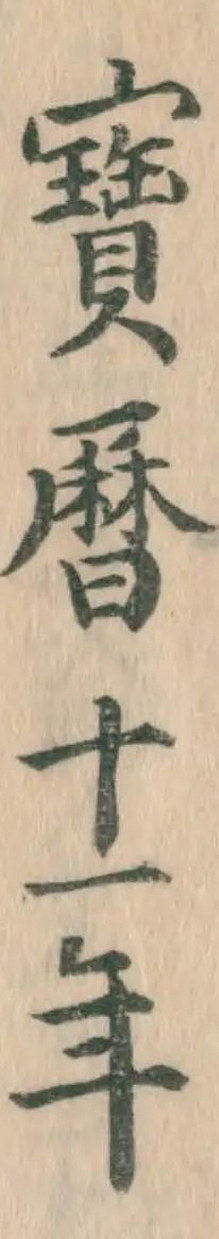宝暦十一年
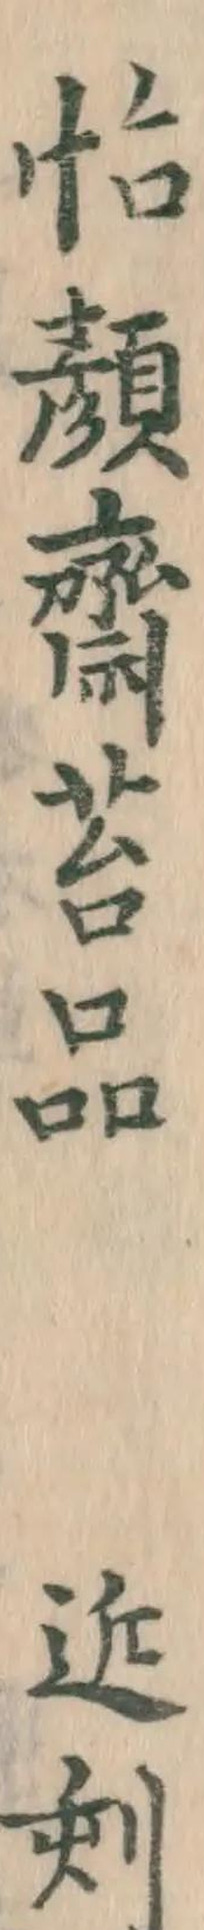怡顔齋苔品近刻
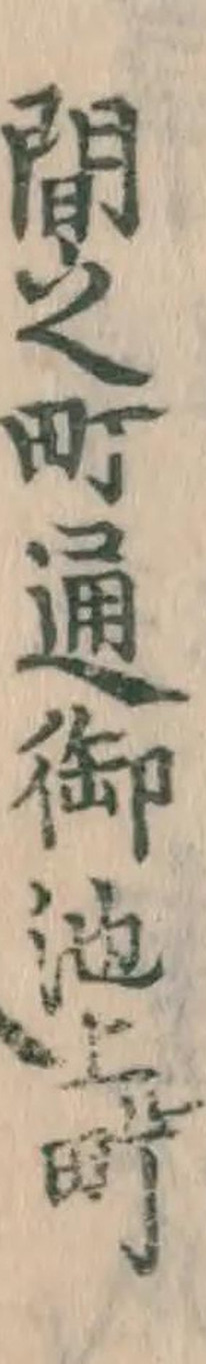間之町通御池上町
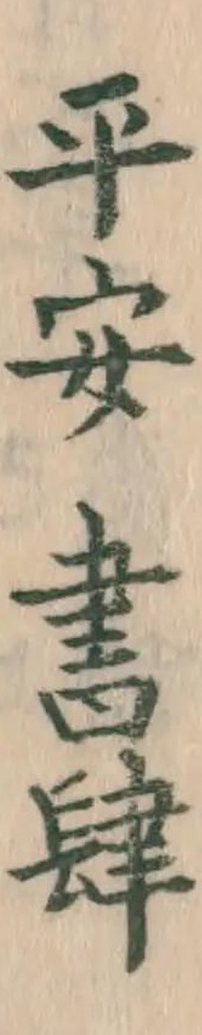平安書肆
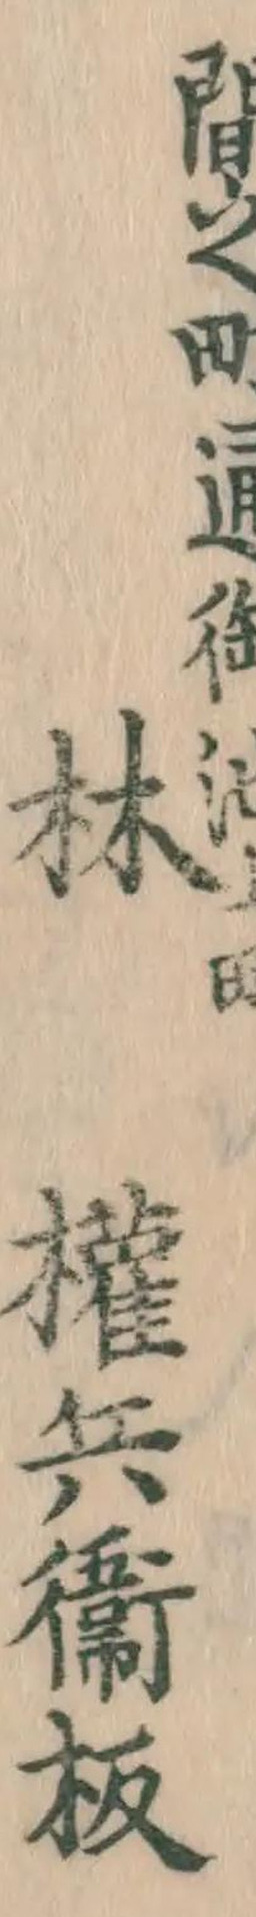林権兵衛板
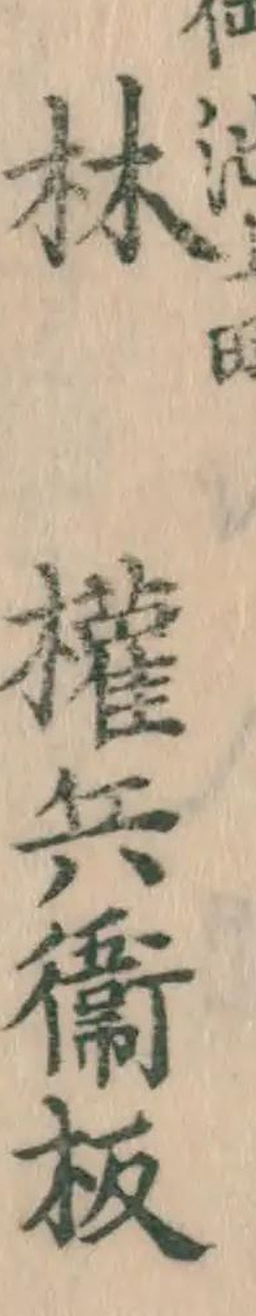林権兵衛板
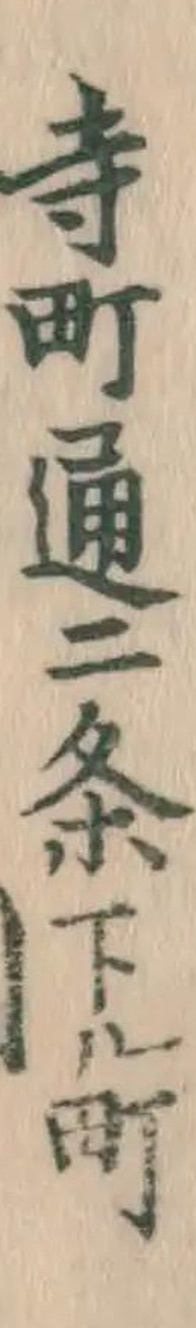寺町通二条下町
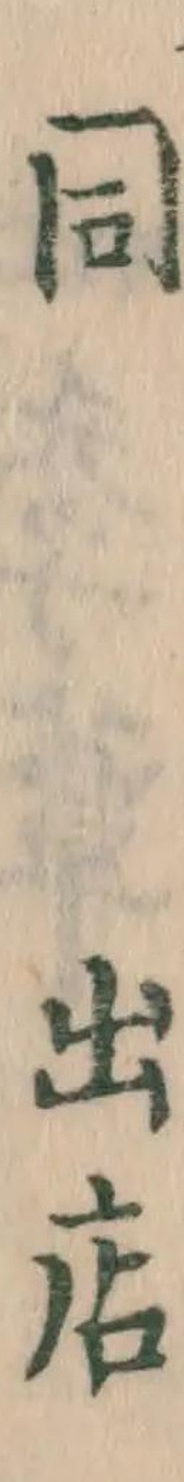同出店
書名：怡顔斎菌品 2巻
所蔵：国立国会図書館 National Diet Library, JAPAN
